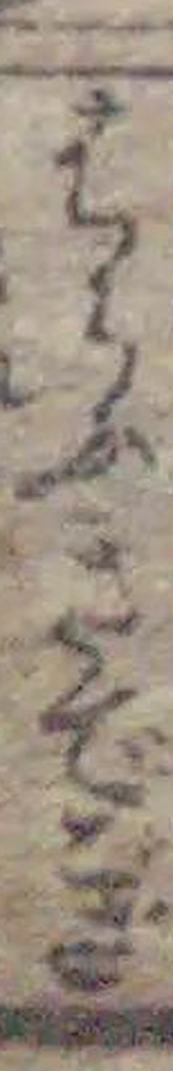はらふきでござ
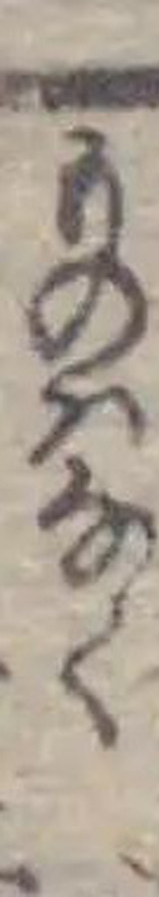ものはなく
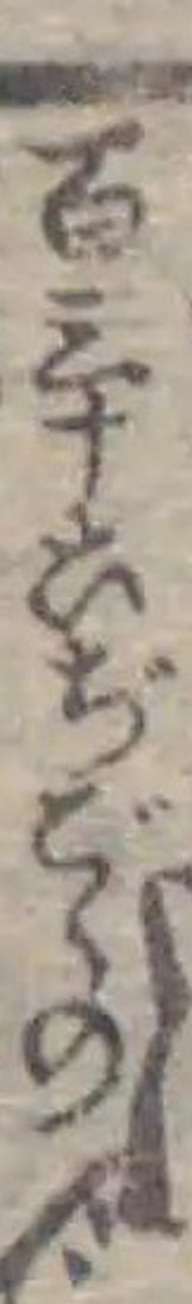百三十六ぢごくの
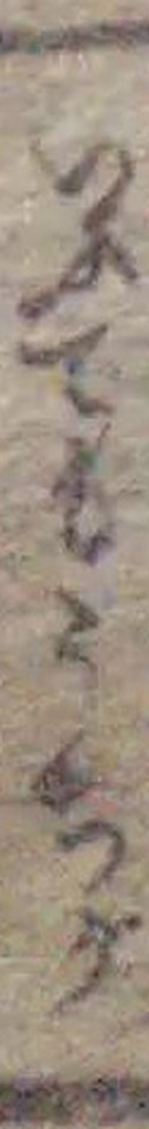いふてもうちが
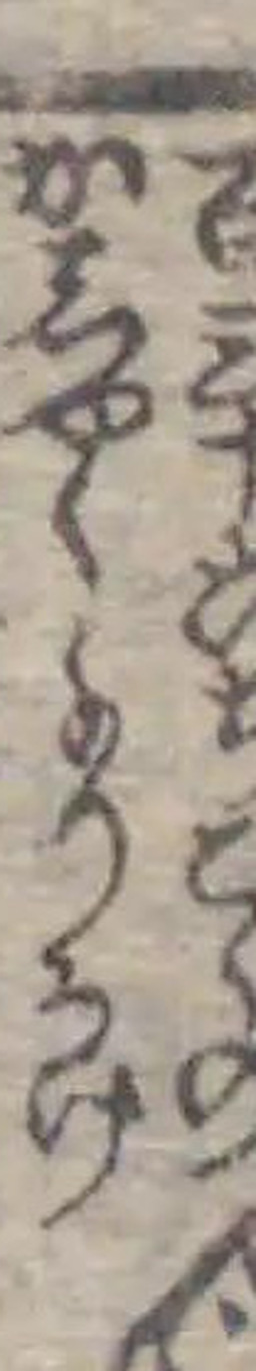かしやくよりかけ
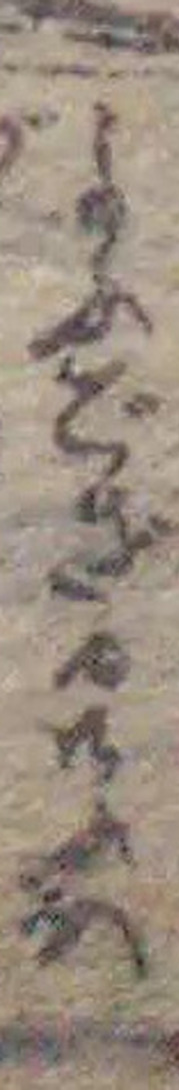よふござるけふは
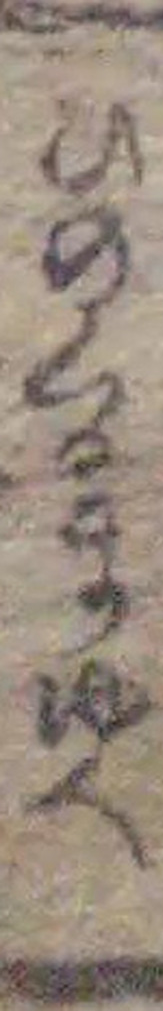ひのくるまゆへ
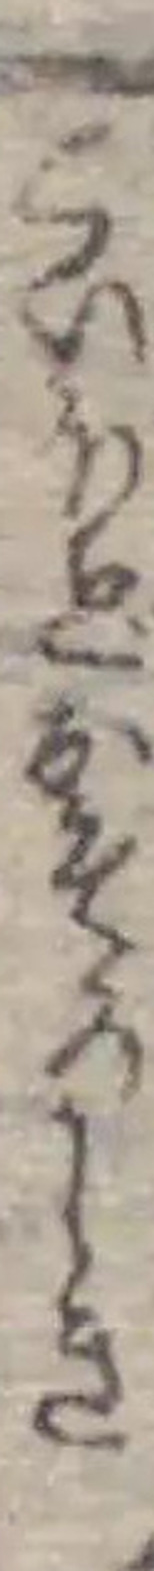こいほどおそろしき
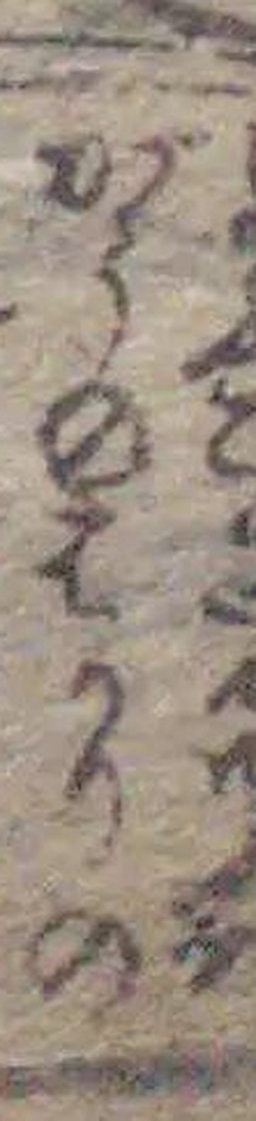がうのはかりの
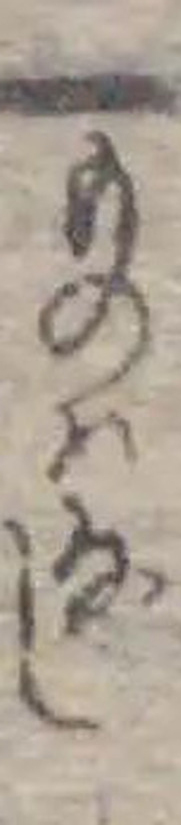ものはなし
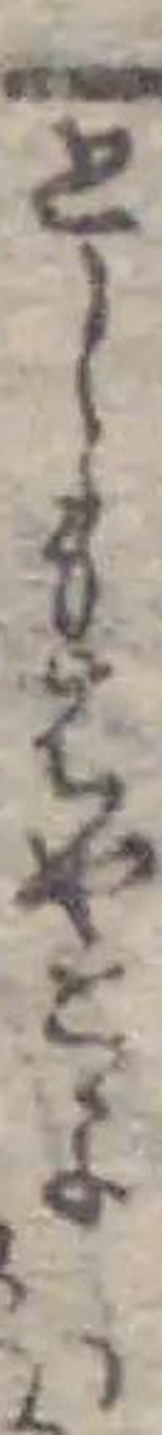としもはやこよ
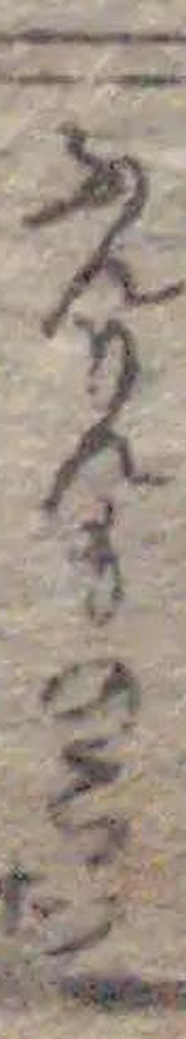ふんりんものこら
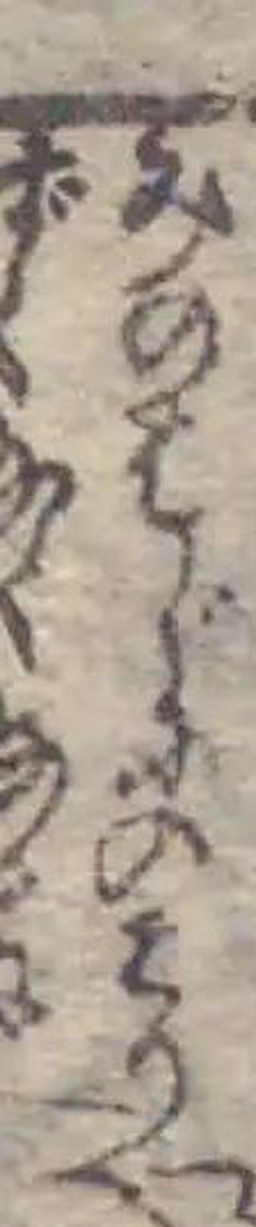ずくなくなるに
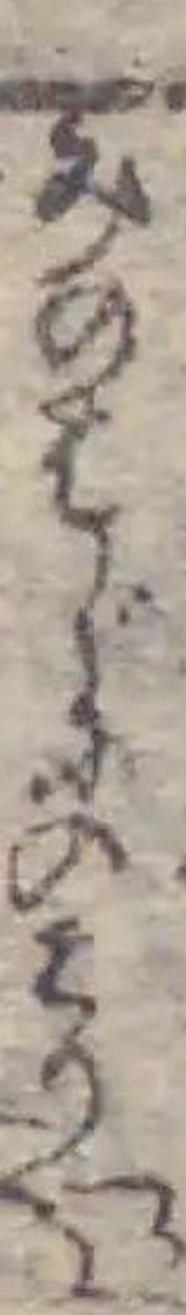みのはじにのこり
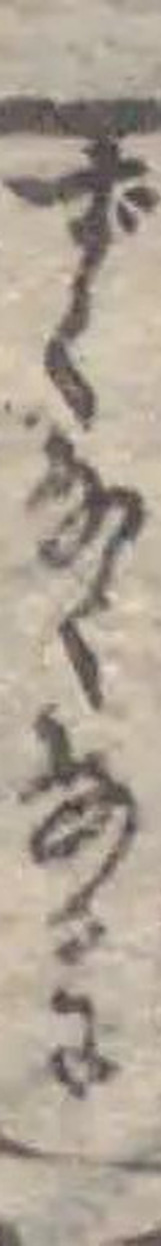ずくなくなるに
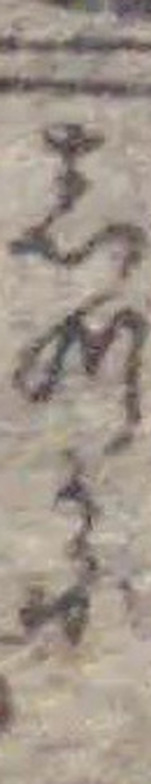しづかに
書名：福壽海旡量品玉 3巻
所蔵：国立国会図書館 National Diet Library, JAPAN
